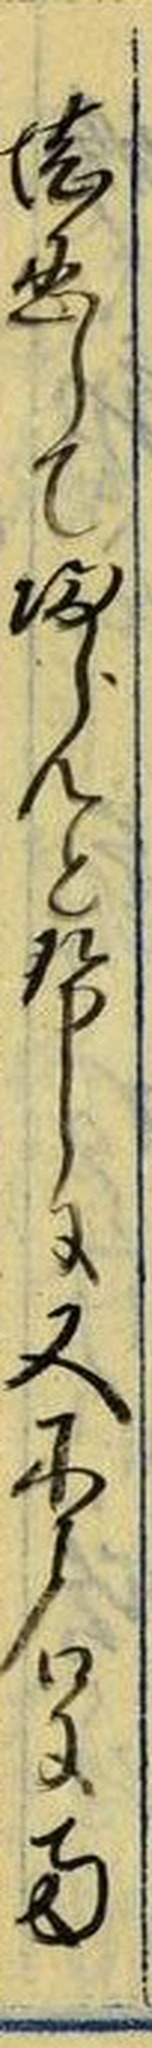堪忍して帰らんとせしに又木戸口に両
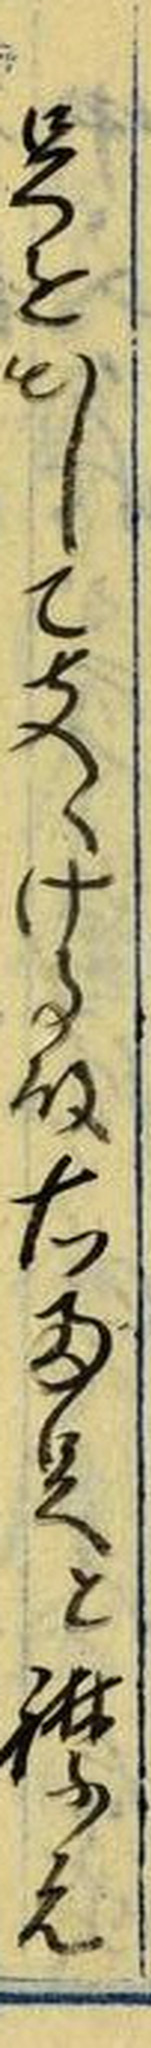足を出して支へける故右両足と襟元
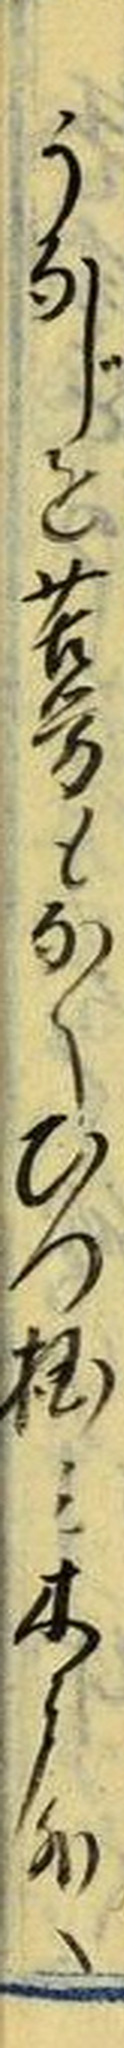うなじを苦労もなくひつ掴ミ木戸外へ
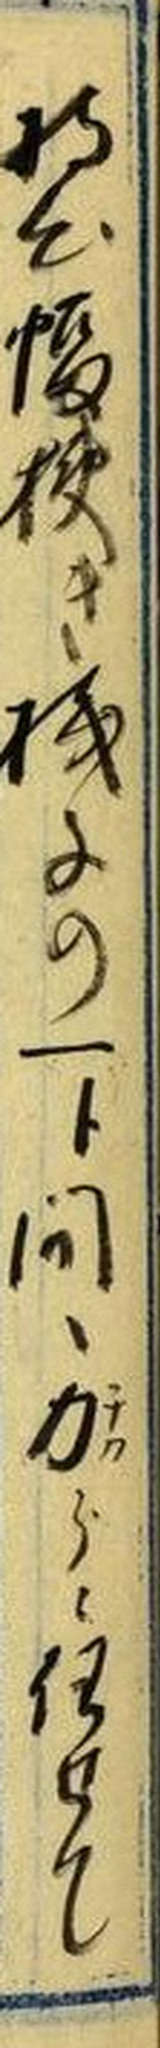持出幅狭き桟子の一ト間へ力らニ任せて
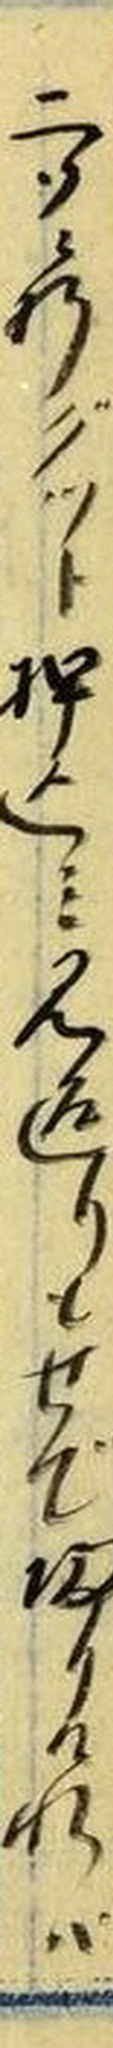二ツニ折グツト押込ミ見返りもせで帰りけれバ
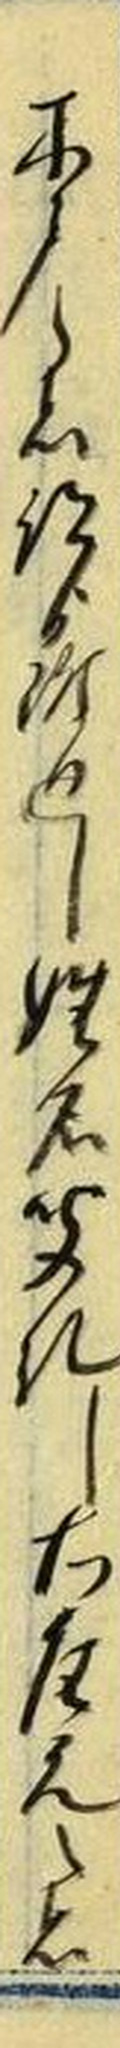木戸之者跡ゟ附廻し姓名聞糺し右座元之者
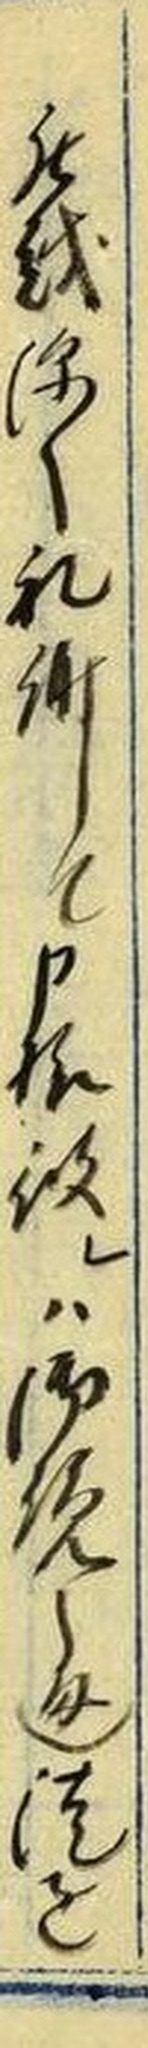罷越深く礼謝して申様彼レハ御覧之通徒を
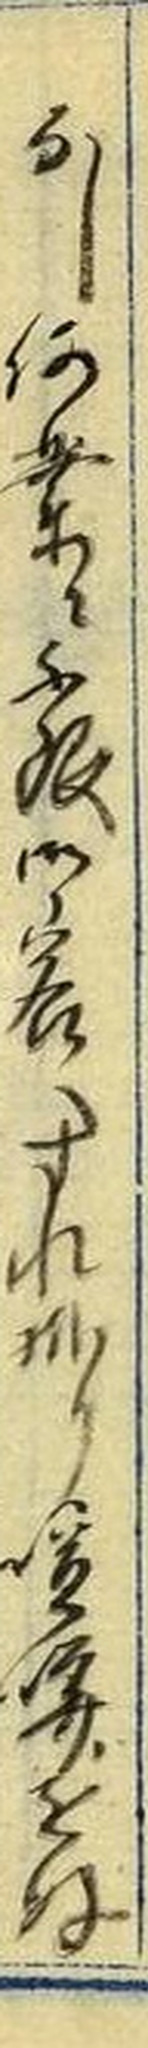なし何業ニ不限御客へすれ掛り喧嘩を好
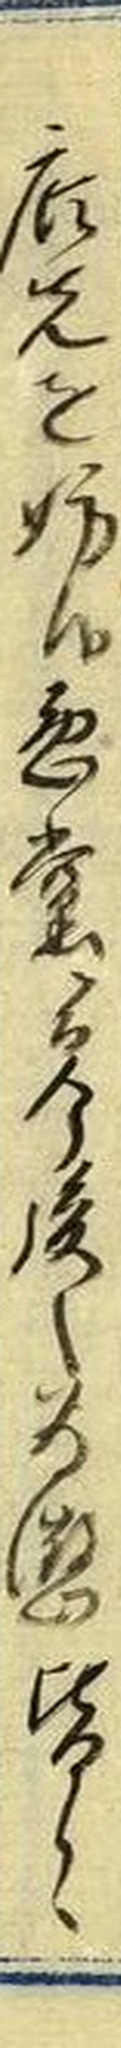店先を妨候悪党ニ而今後之為懲皆々
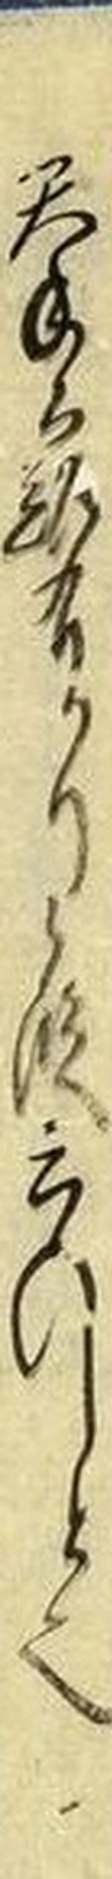挙而難有かり候段云いしと也

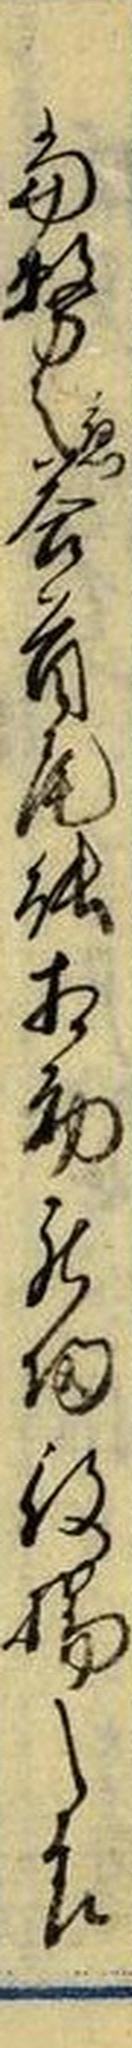当務之応答首尾能相勤罷帰役揚之節
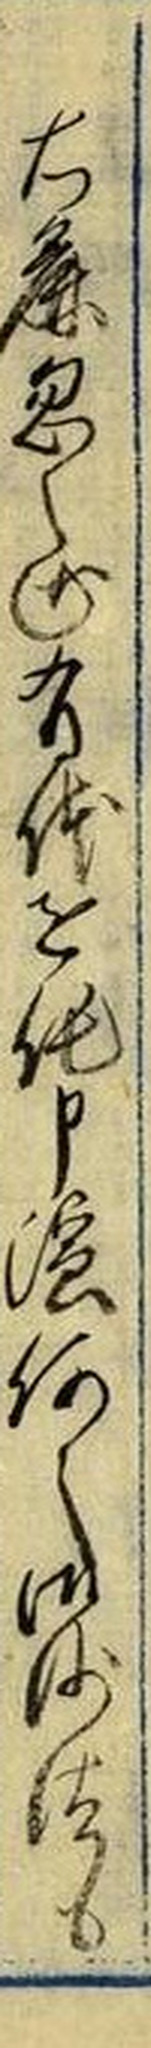右麁忽之趣有体を仛申演何之御沙汰も
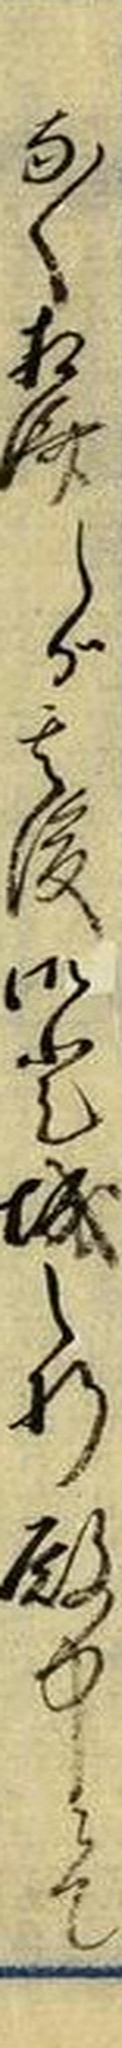なく相済しが其後御登城之折殿中ニて
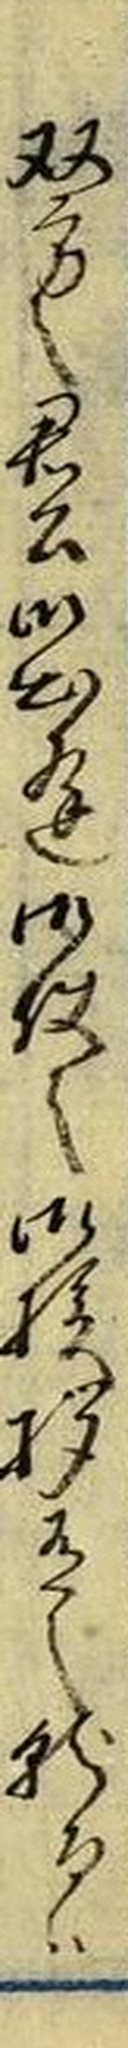双方之君公御出逢御使之御挨拶有之就而ハ
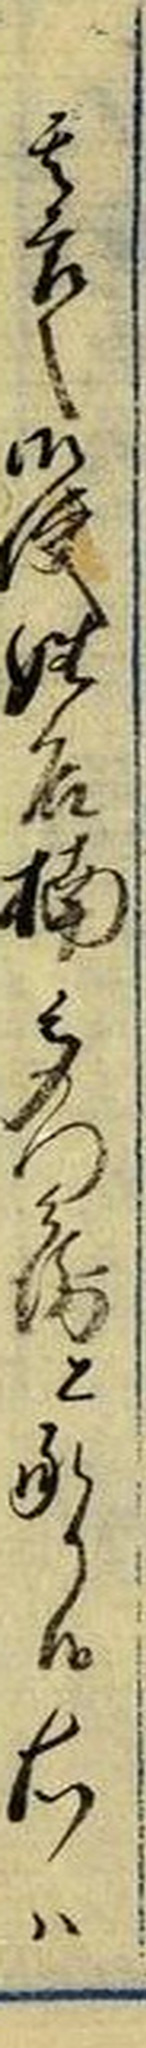其節之御使姓名楠多門兵衛と承り候右ハ
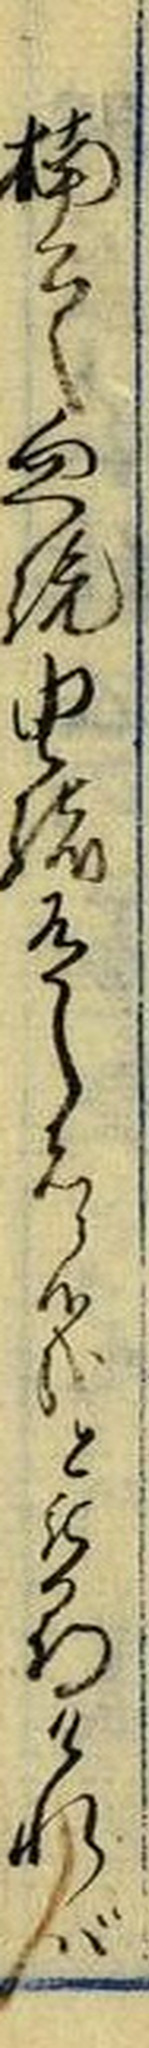楠公之血流由緒有之者ニ候哉と被尋けれバ
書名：温古集 三巻
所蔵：福井県文書館 Fukui Prefectural Archives
